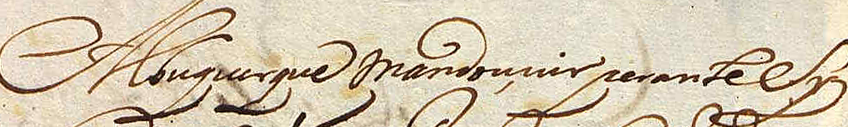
Albuquerque mandou uir perante Sy
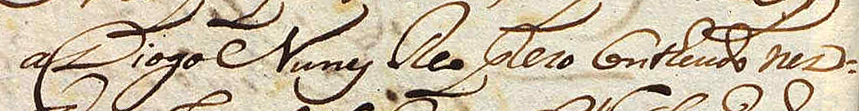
a Diogo Nunes Reo pRezo Contheudo nez
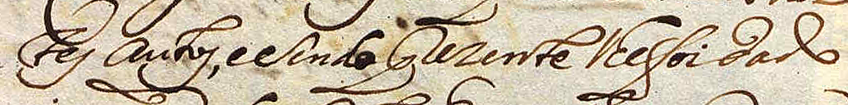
tes autos, e sendo pRezente lhe foi dado
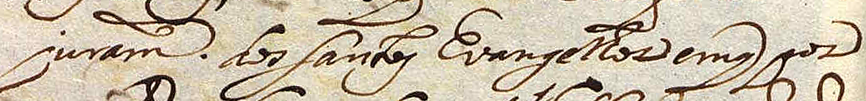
juramto. dos santos Evangelhos em q̄ poz
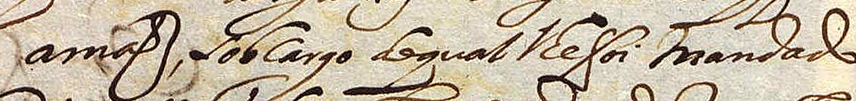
a maõ, sob cargo do qual lhe foi mandado
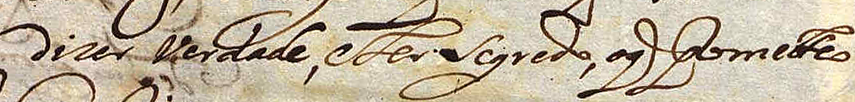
dizer verdade, e ter segredo, o q̄ pRometteo
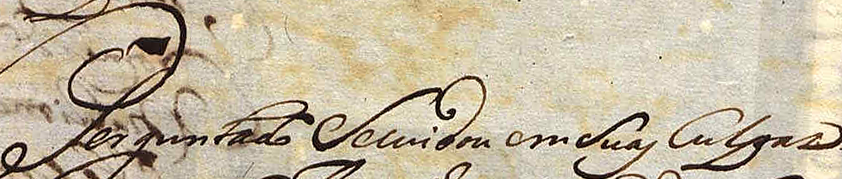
Perguntado Se cuidou em Suas Culpas
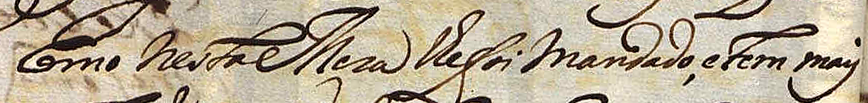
Como nesta Meza lhe foi mandado, e tem mais
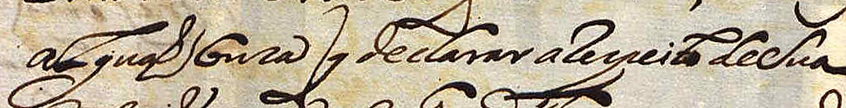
alguā Couza q̄ declarar a Respeito de Sua
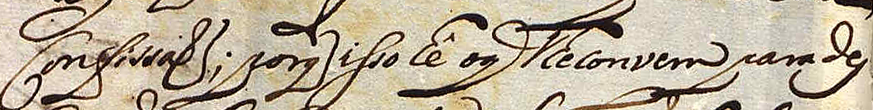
Confissaõ; porq̄ isso hê o q̄ lhe convem para des
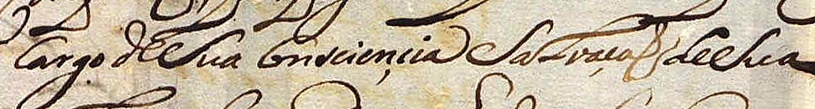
Cargo de Sua Consciencia Salvaçaõ de Sua
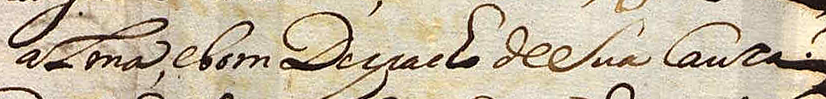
aLma, e bom Despacho de Sua Cauza
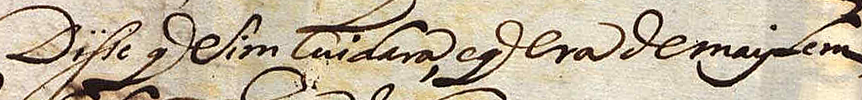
Disse q̄ Sim cuidara, e q̄ era de mais Lem
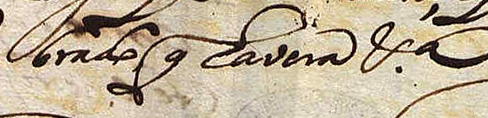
brado q̄ havera &.a
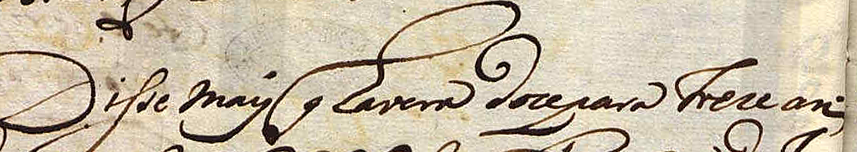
Disse mais q̄ havera doze para treze an
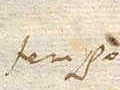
tempo
